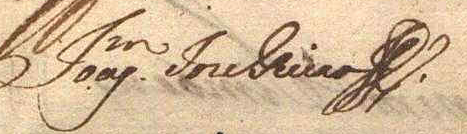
Ioaq.m Ioze Guiao
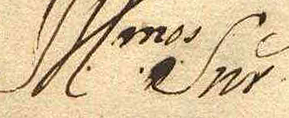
Ill.mos Snr.es
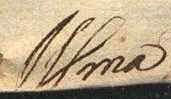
Jllma
